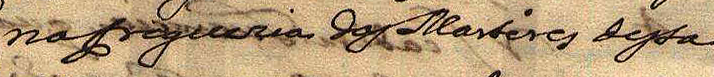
na freguezia dos Martires desta
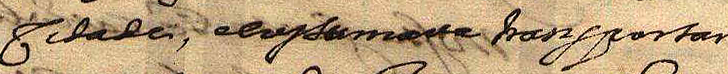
Cidade, e costumava transportar
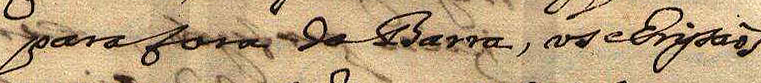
para fora da Barra, os christaõs
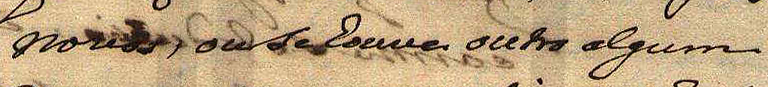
novos, ou se houve outro algum
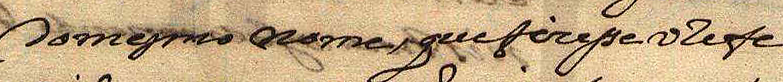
do mesmo nome, que fizesse o Refe
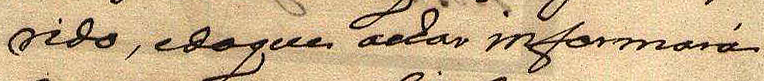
rido, e do que achar informará
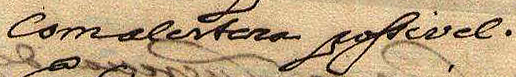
com a certeza possivel.
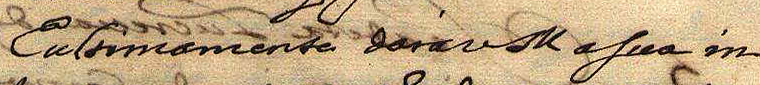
E ultimamente dara vM a sua in
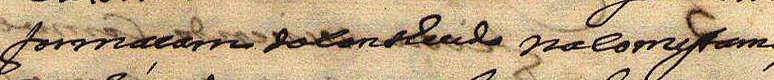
formaçam do contheudo na comissam,
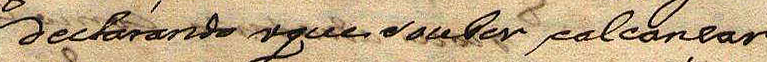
declarando o que souber, e alcançar
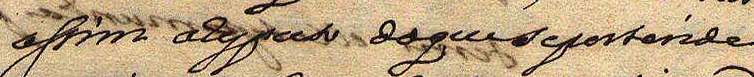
assim a respeito do que se pertende
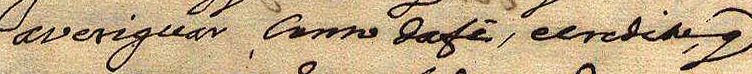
averiguar, como da fé, e credito q̄
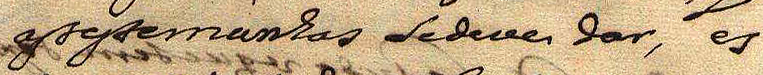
as testemunhas se deve dar, es
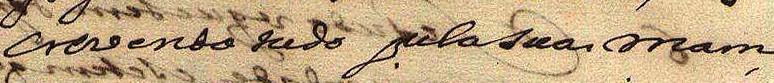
crevendo tudo pela sua mam,
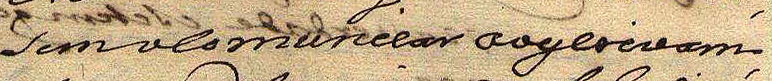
sem o comunicar ao escrivam,
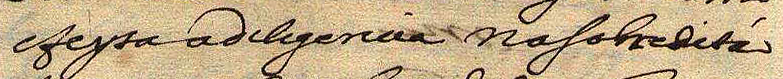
e feyta a diligencia na sobredita
